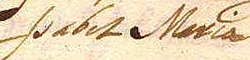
Jsabel Maria
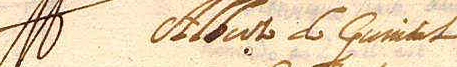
Alberto do Quintal
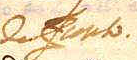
defunto.
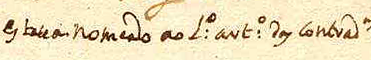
estaua nomeado ao 1:o art.o das contradas.
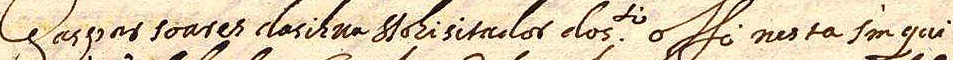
Gaspar soares da silua ssolisitador do s.to offo nesta Imqui
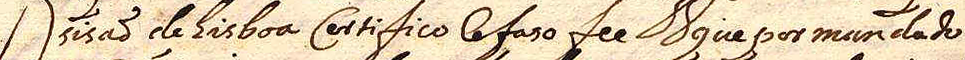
sisaõ de lisboa Certifico E faso fee que por mandado
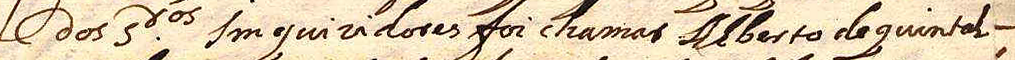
dos s.rēs Jmquizidores foi chamar Alberto de quintal
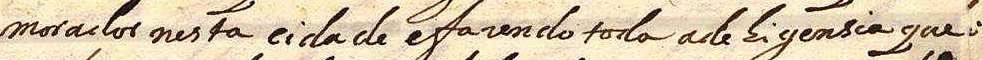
morador nesta cidade e fazendo toda a deligensia que
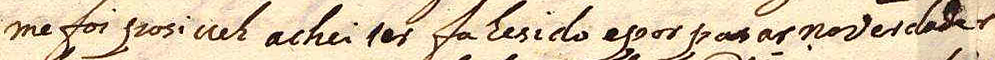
me foi posiuel achei ser falesido e por pasar na verdade
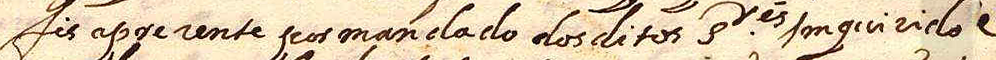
fis a prezente por mandado dos ditos S.res̄ Imquizido
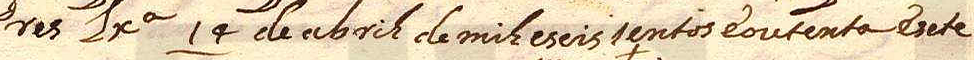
res Lxa 14 de abril de mil e seissentos e outenta e sete
